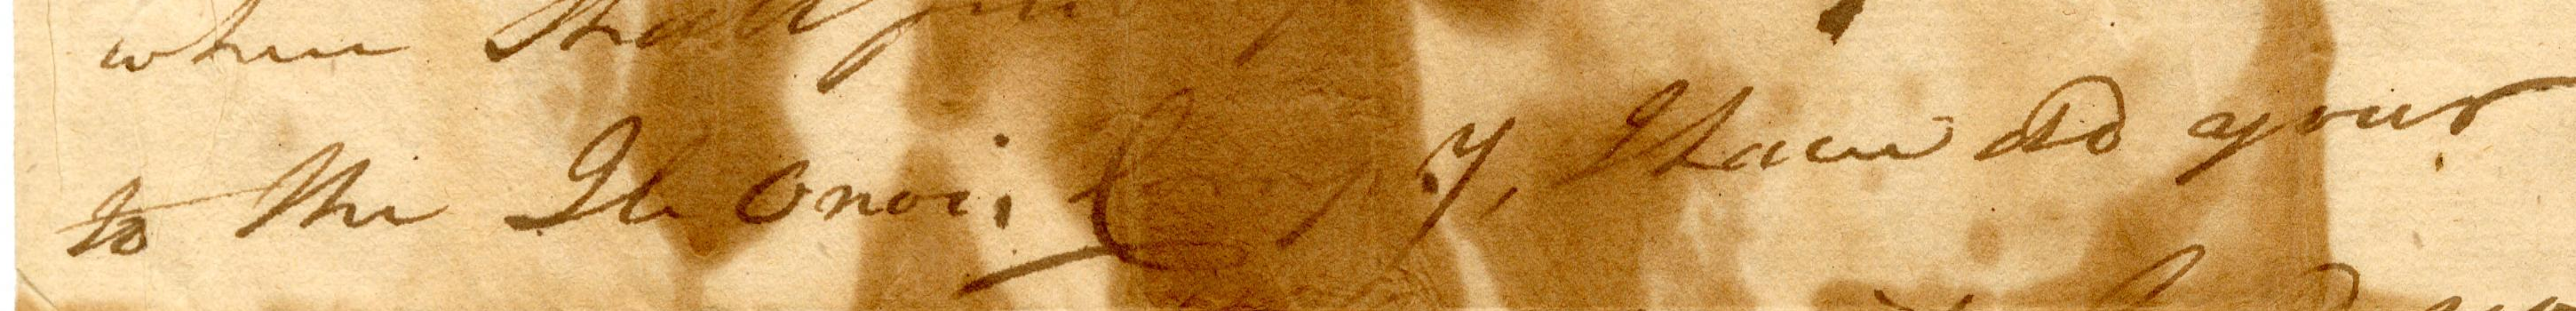to the Illinois Comp^y, I have ad your
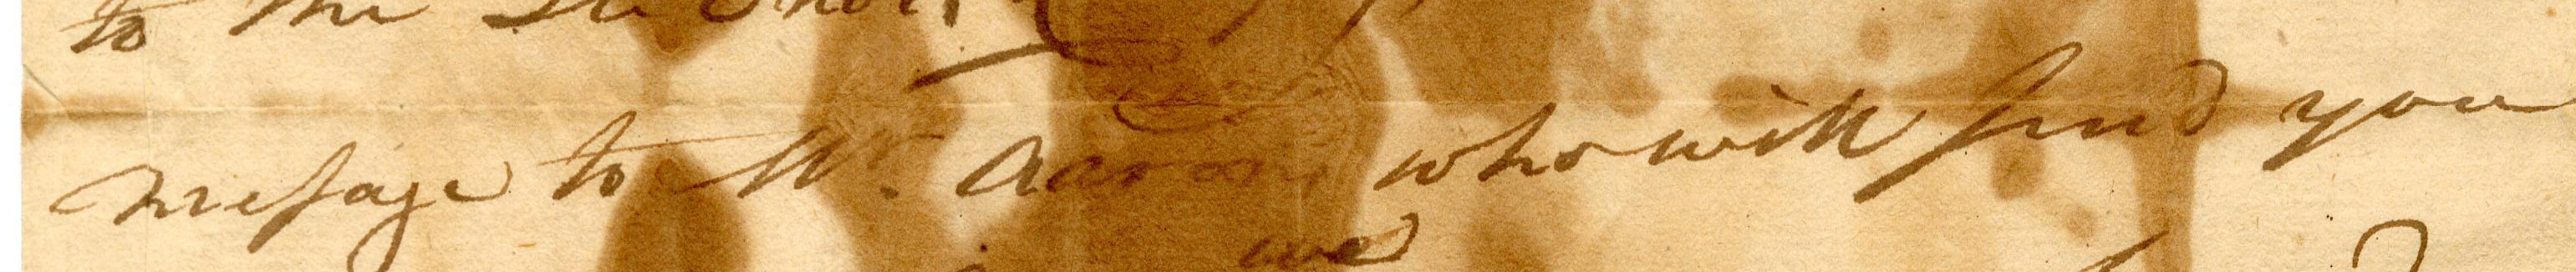message to M^r. Aaron who will find you
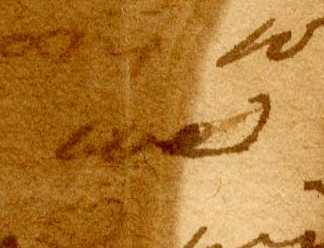one
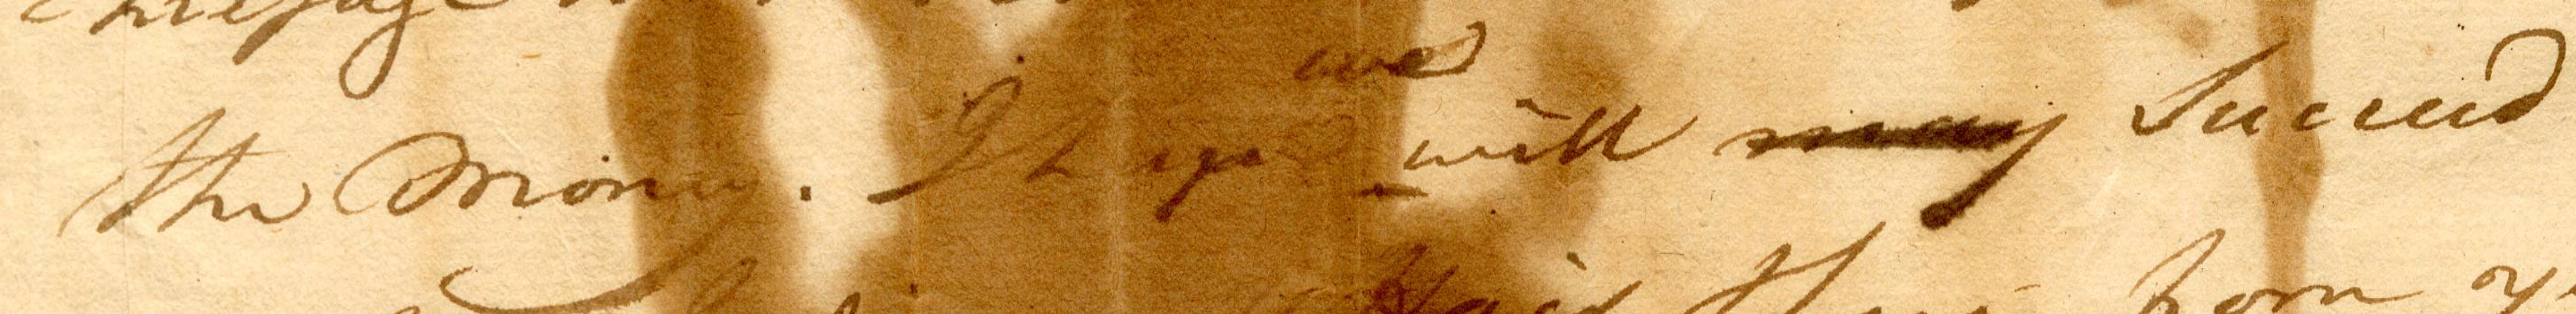the money. I [hope] will [may] succeed
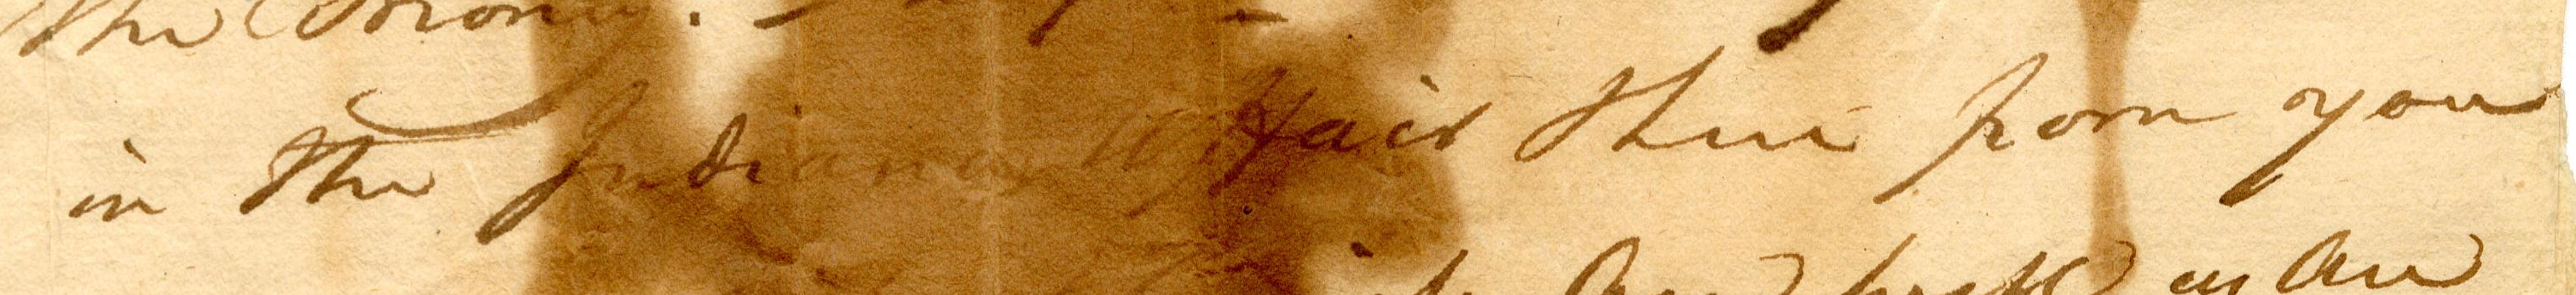in the Indiana affair I hear from you
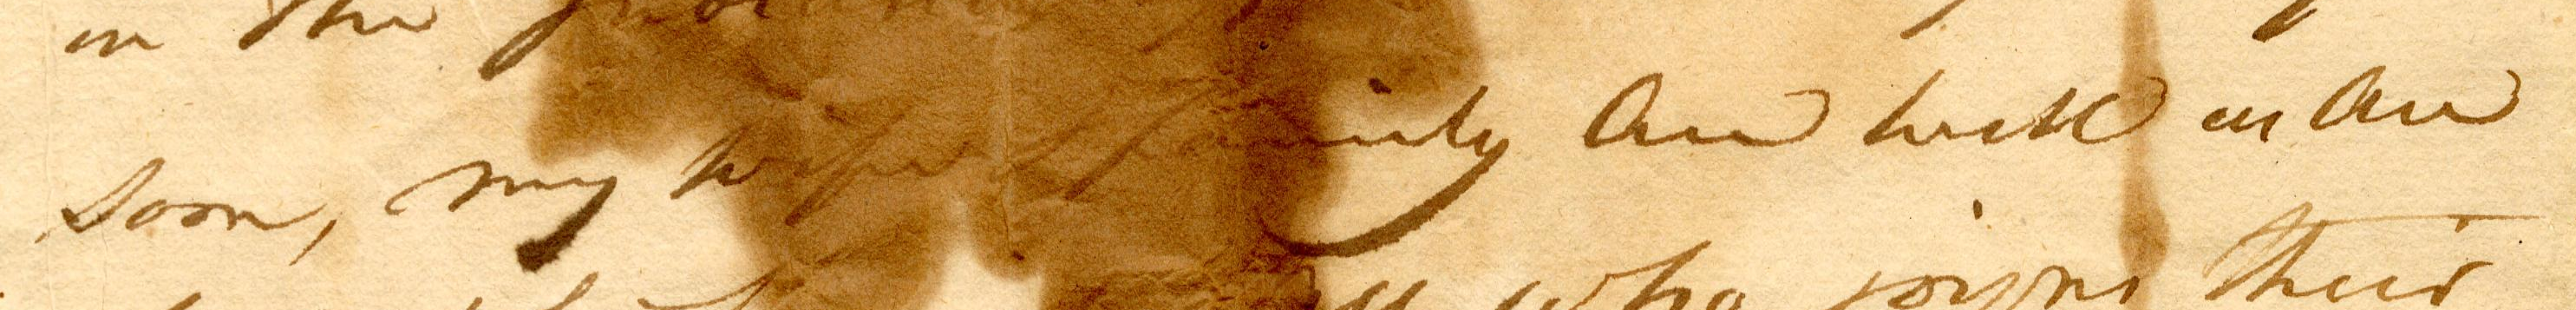soon, my wife & family are well as Are
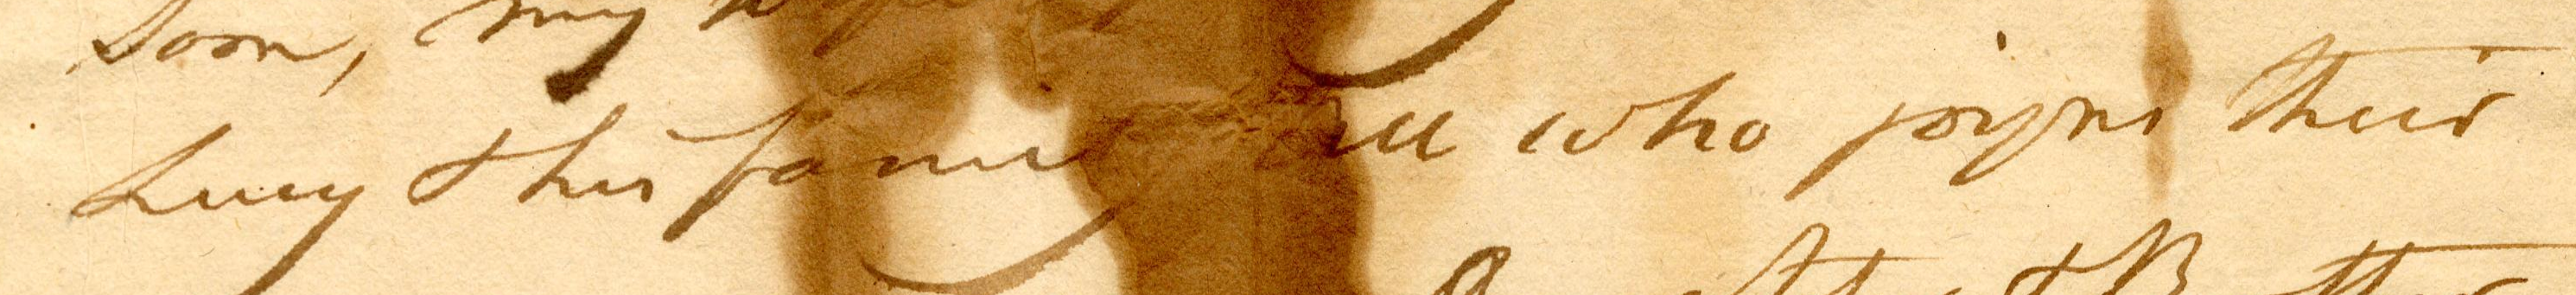Lucy & his family who joyn their
